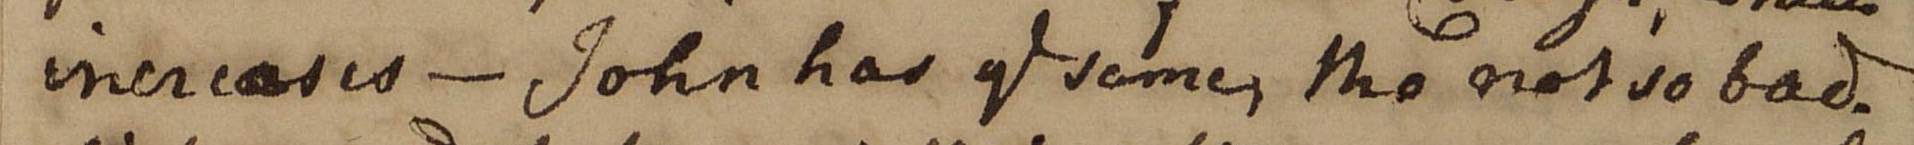increases- John has y^e same, tho not so bad.
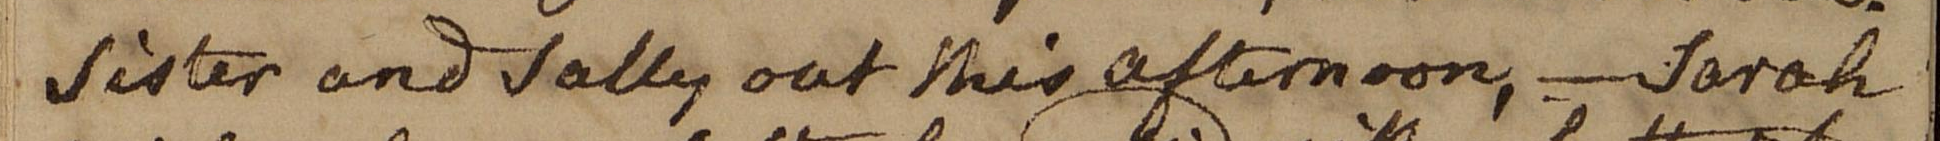Sister and Sally out this afternoon,- Sarah
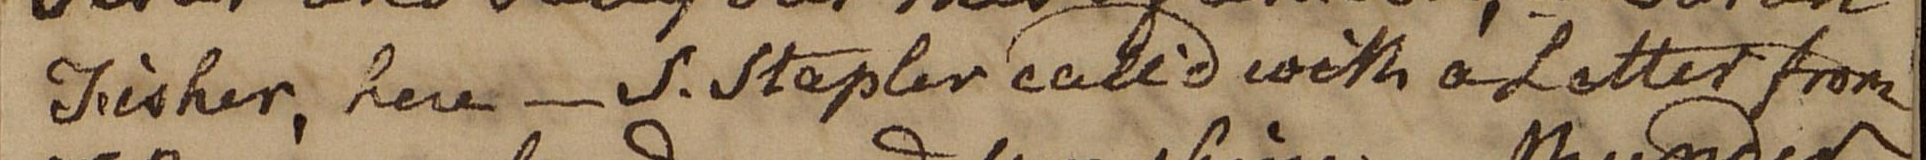Fisher, here- S. Stapler call'd with a Letter from
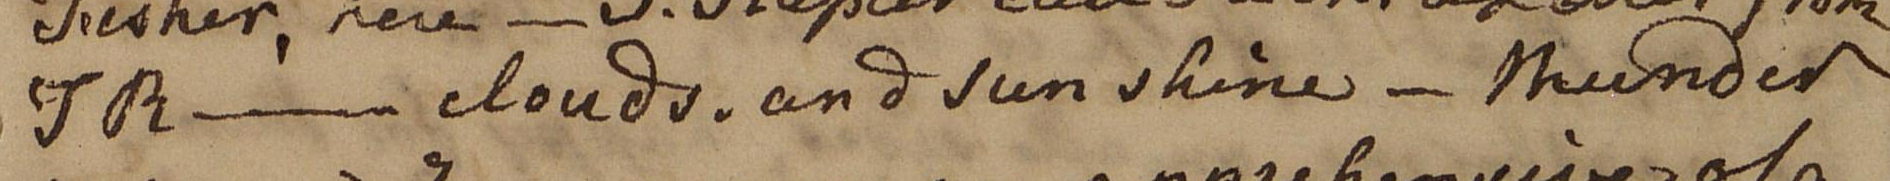TR- clouds. and sun shine- thunder
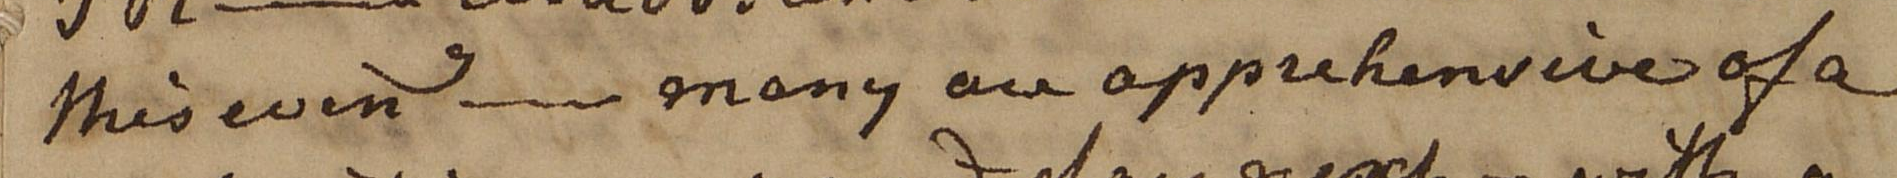this even^g- many are apprehensive of a
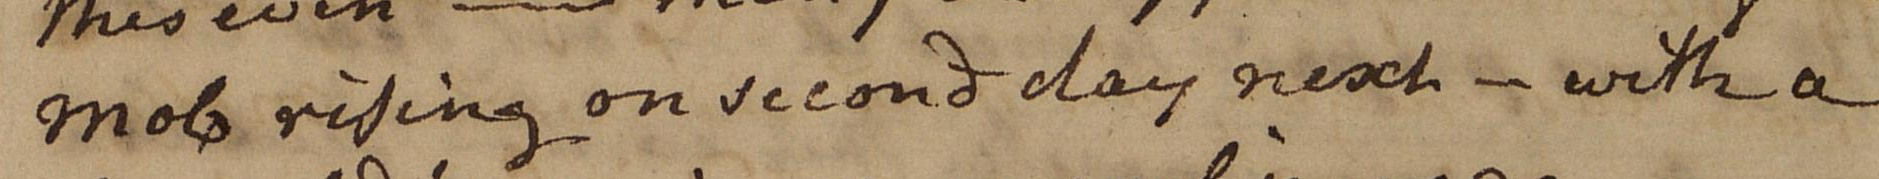mol rising on second day next- with a
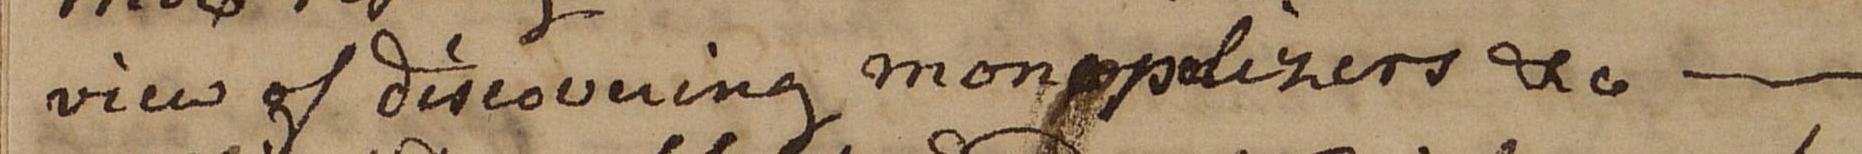vice of discovering monopolizers &c-
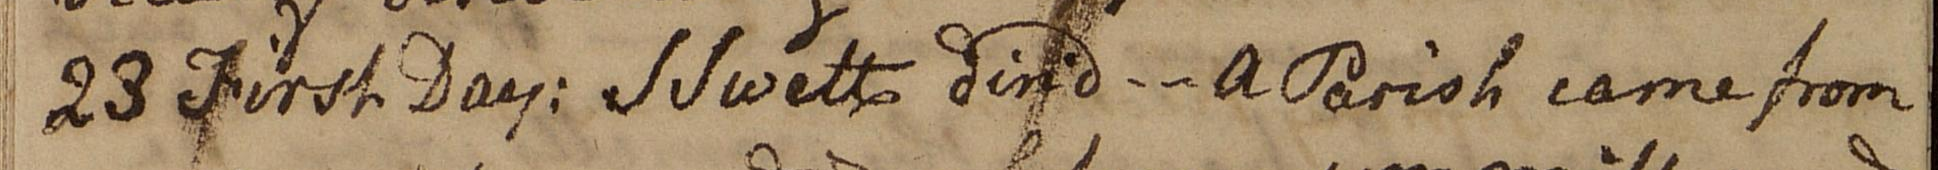23 First Day: S Swett din'd-- A Parish came from
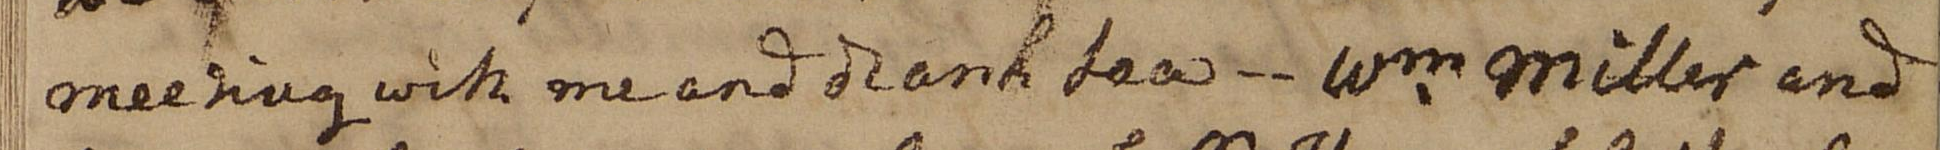meeting with me and drank tea- W^m. Miller and
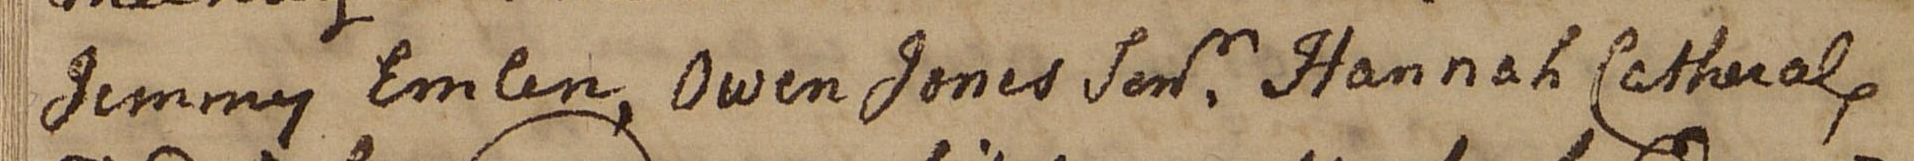Jemmy Emlen, Owen Jones Sen^r. Hannah Catheral
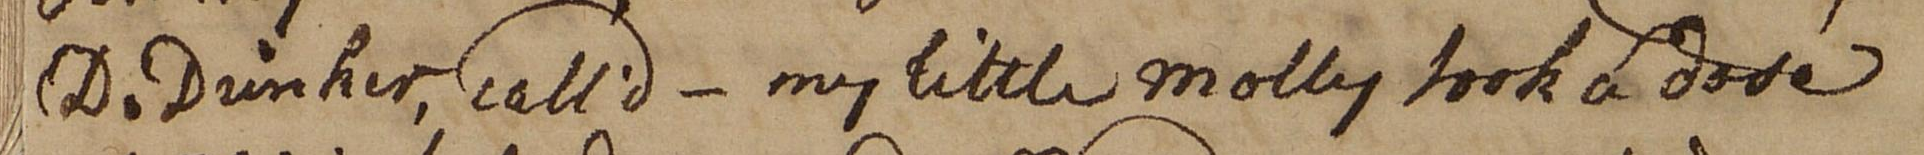D. Drinker, call'd- my little Molly took a dose
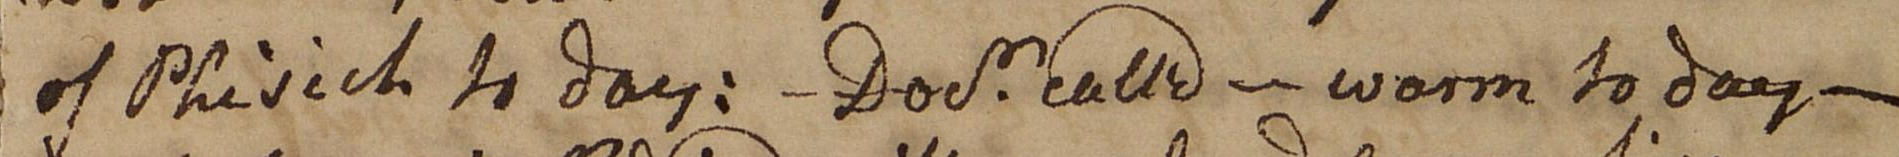of Phisich to day:- Doc^r. call'd- worm to day-
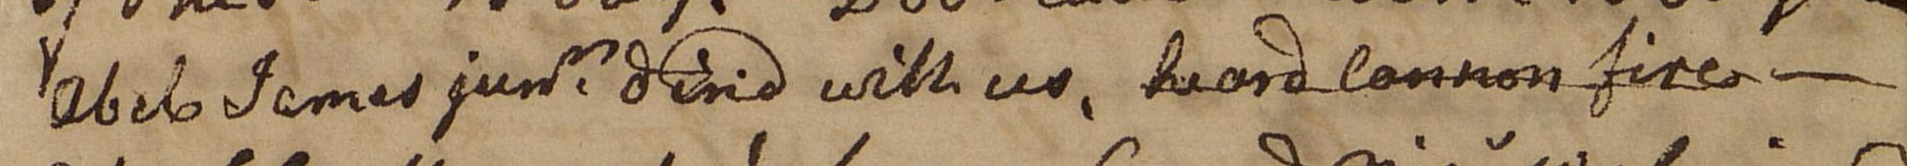Abel James jun^r. din'd with us, hard Cannon fire-
